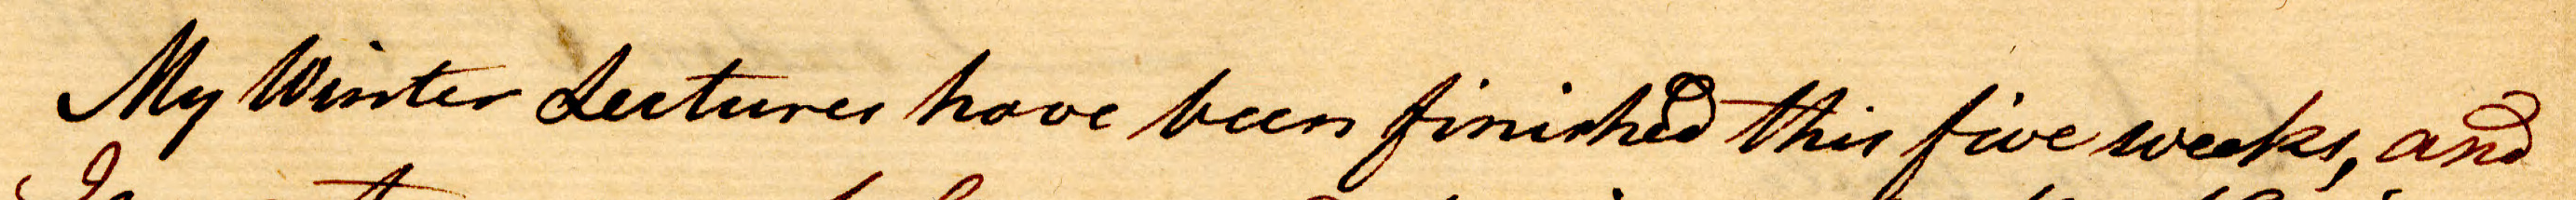My Winter Lectures have been finished this five weeks, and
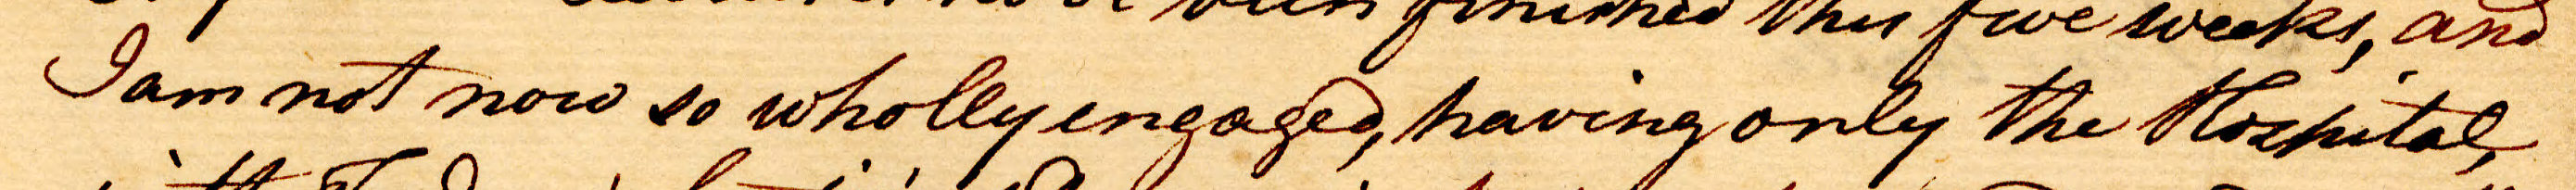I am not now so wholly engaged, having only the Hospital,
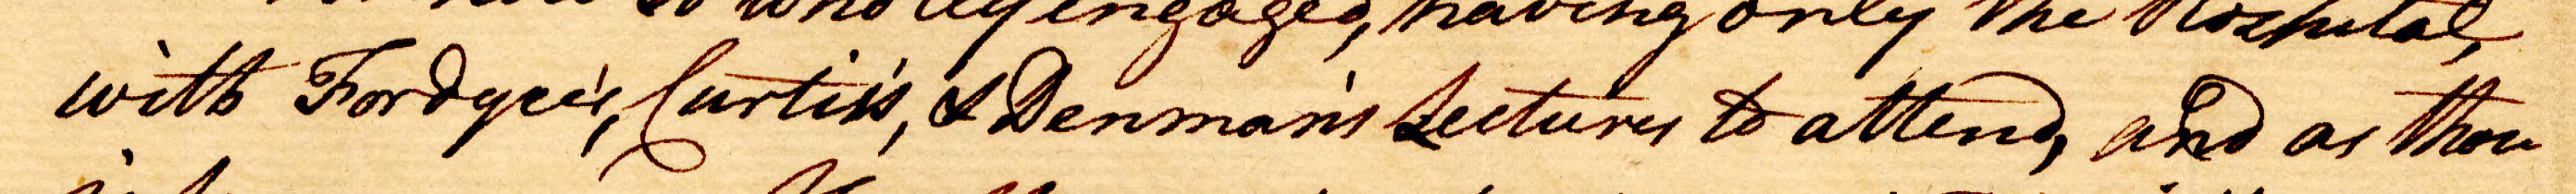with Fordyce's, Curtis's, & Denman's Lectures to attend, and as thou
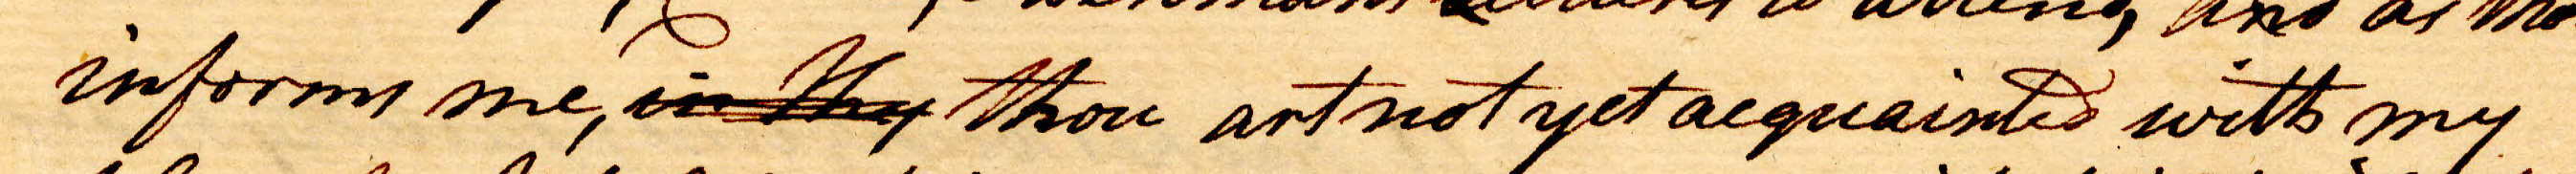informs me, thou art not yet acquainted with my
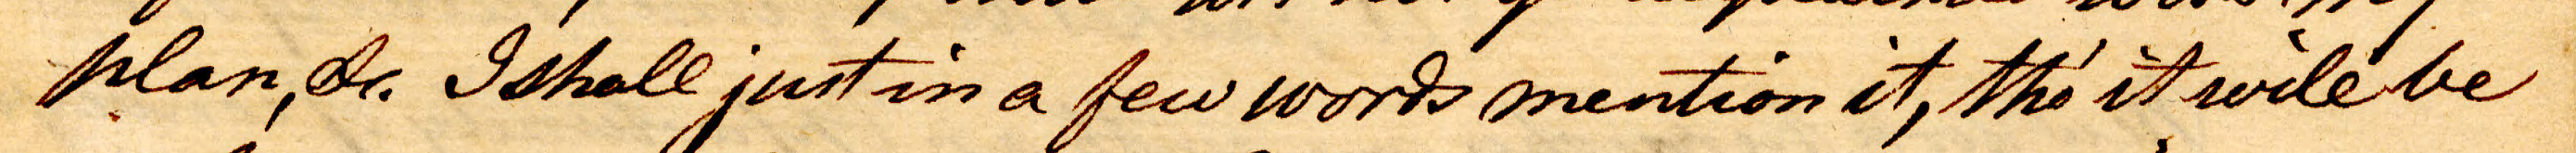plan, &c. I shall just in a few words mention it, tho' it will be
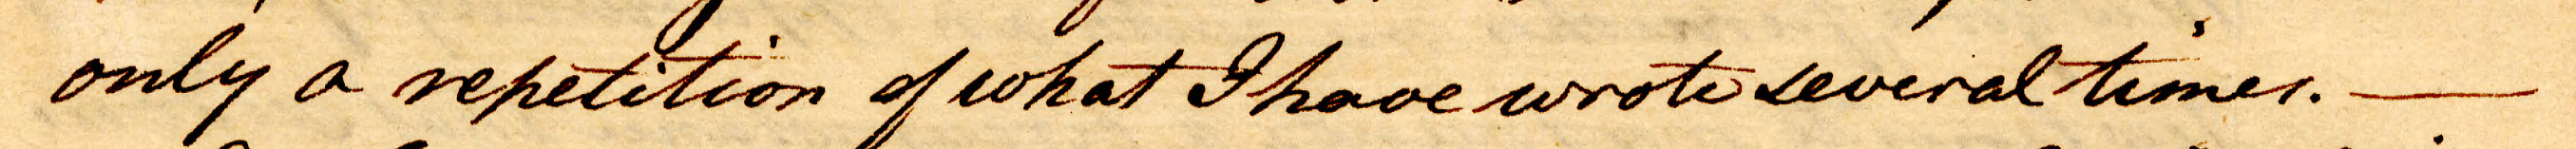only a repetition of what I have wrote several times.-
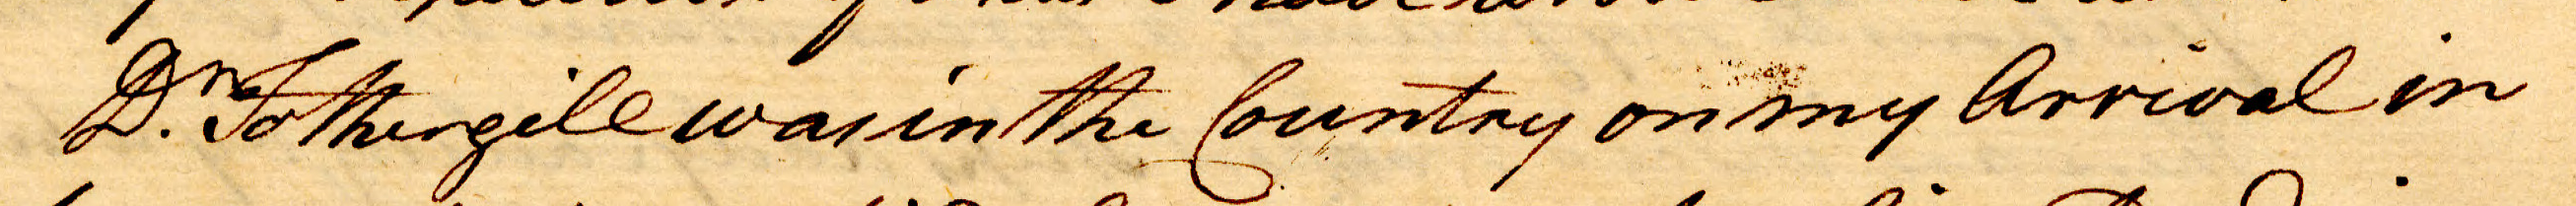D^r. Fothergill was in the Country on my Arrival in
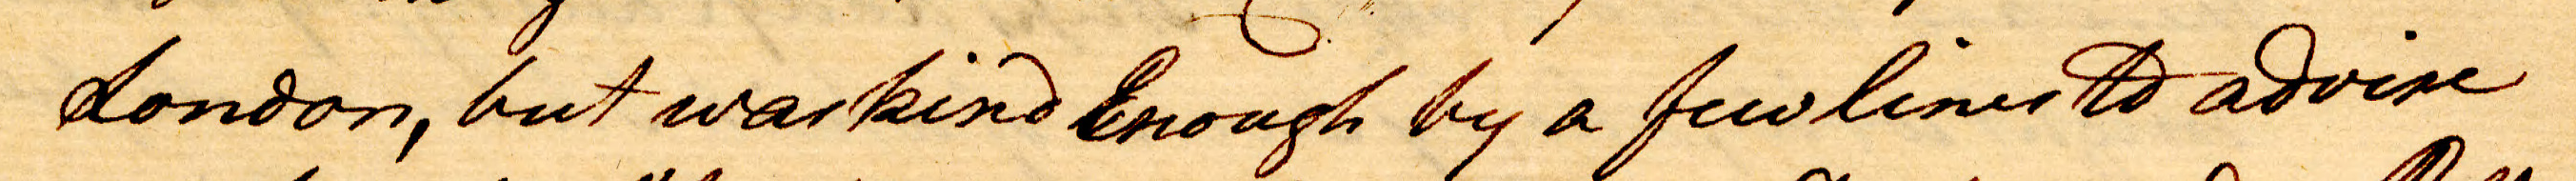London, but was kind Enough by a few lines to advise
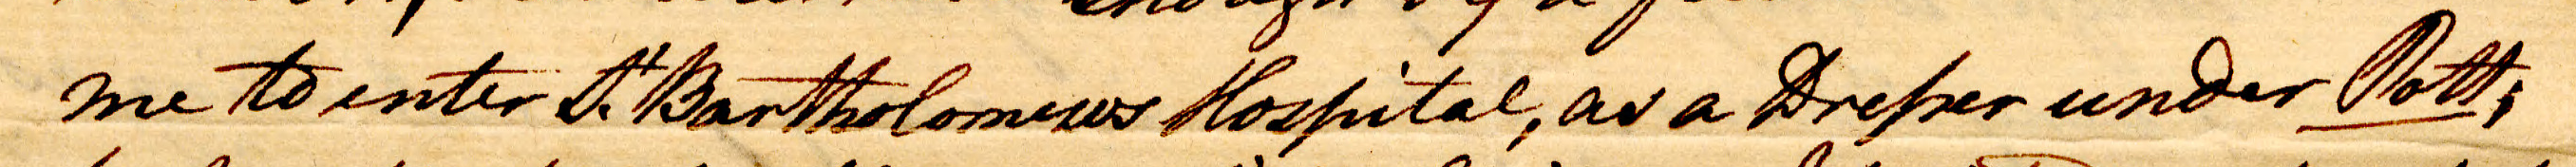me to enter S^t. Bartholomews Hospital, as a Dresser under Potts
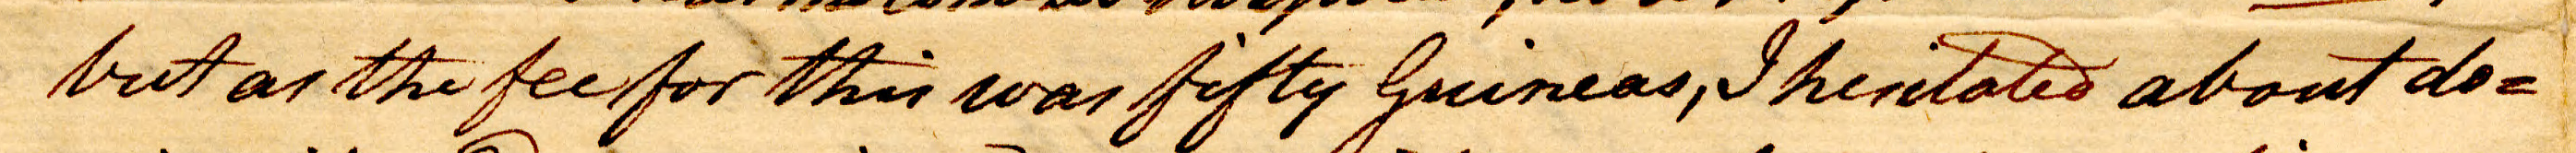but as the fee for this was fifty Guineas, I hesitated about do-
